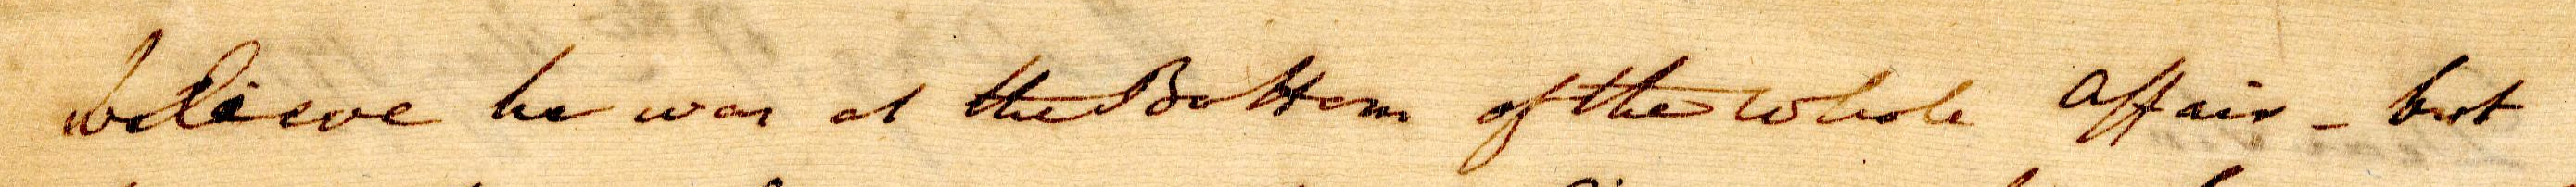believe he was at the Bottom of the whole Affair, but
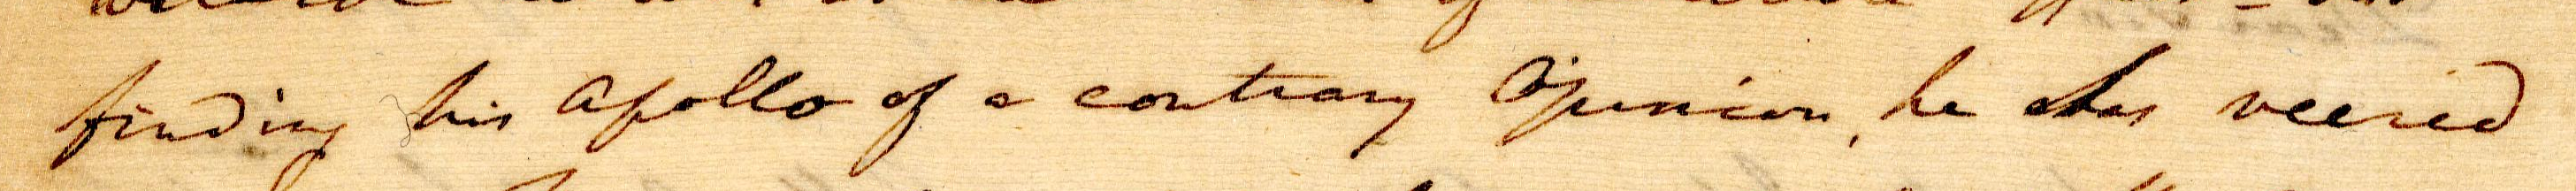finding his apollo of a contrary Opinion he has veered
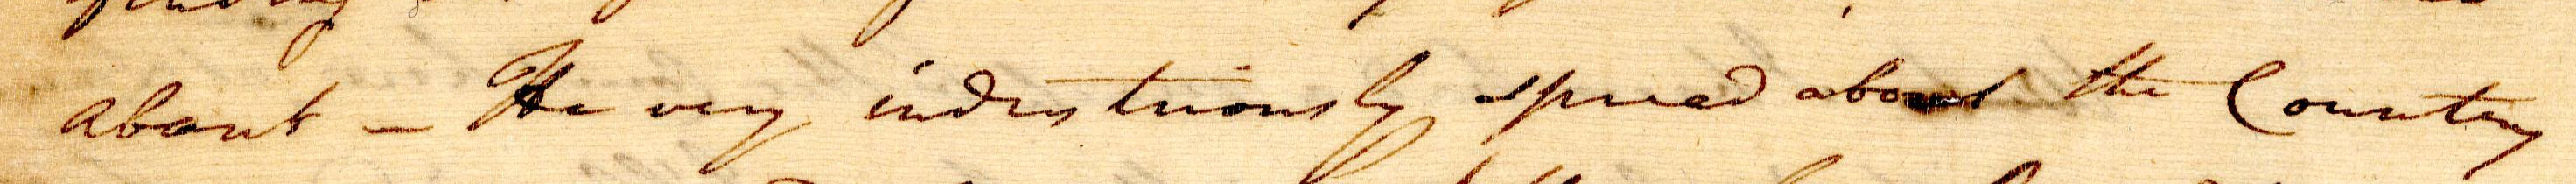about. He may industriously spread about the Country
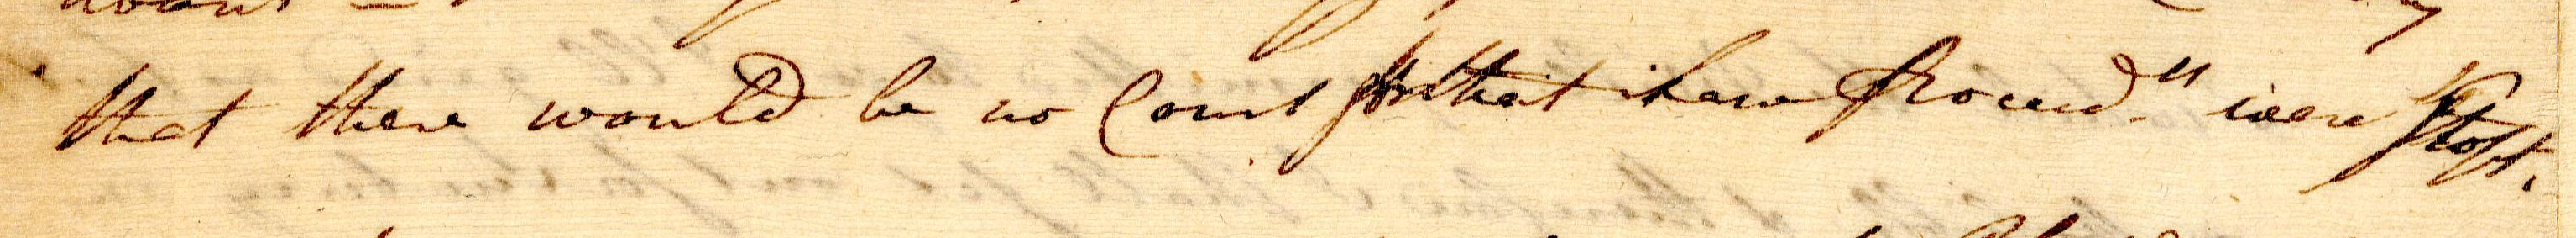that there would be no Court so that Law Proceed" were stopt.
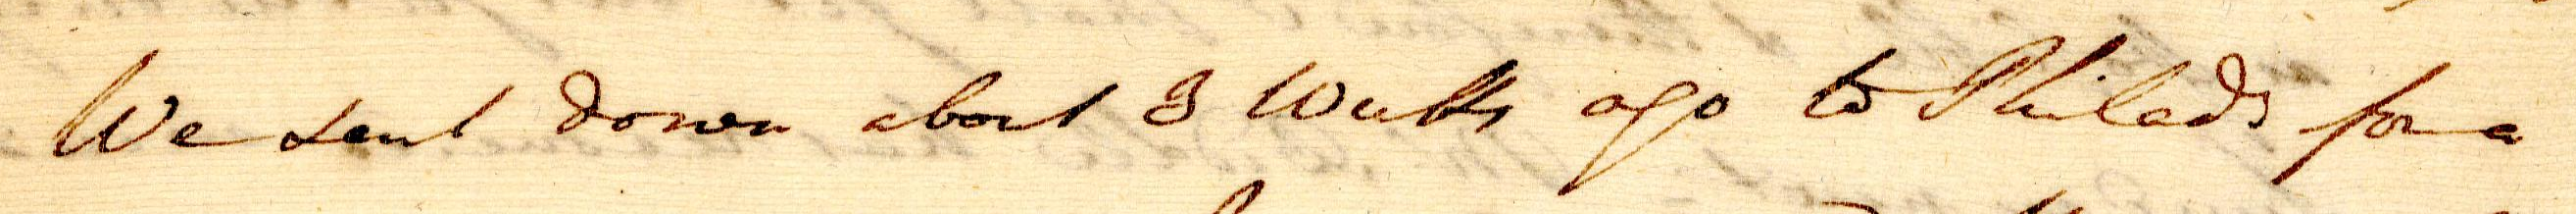We sent down about 8 Weeks also to Philad^a for a
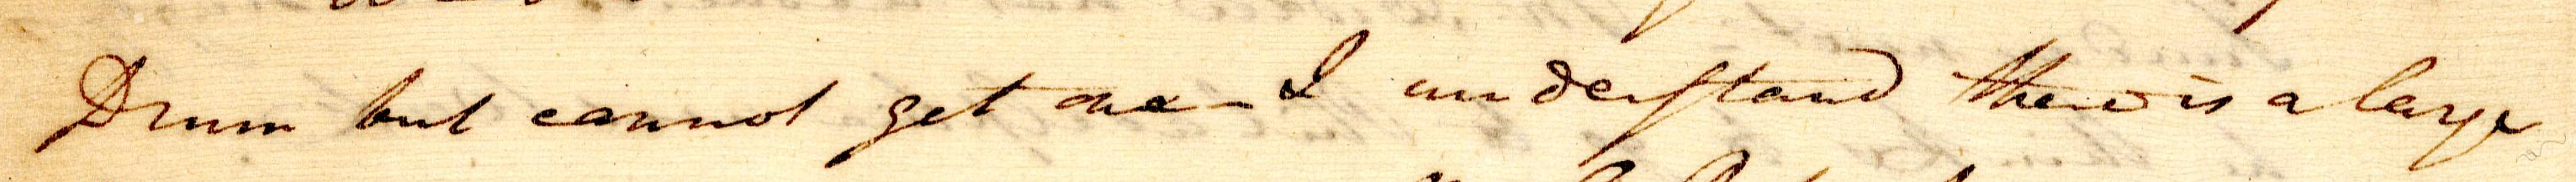Drum but cannot get one. I understand there is a large
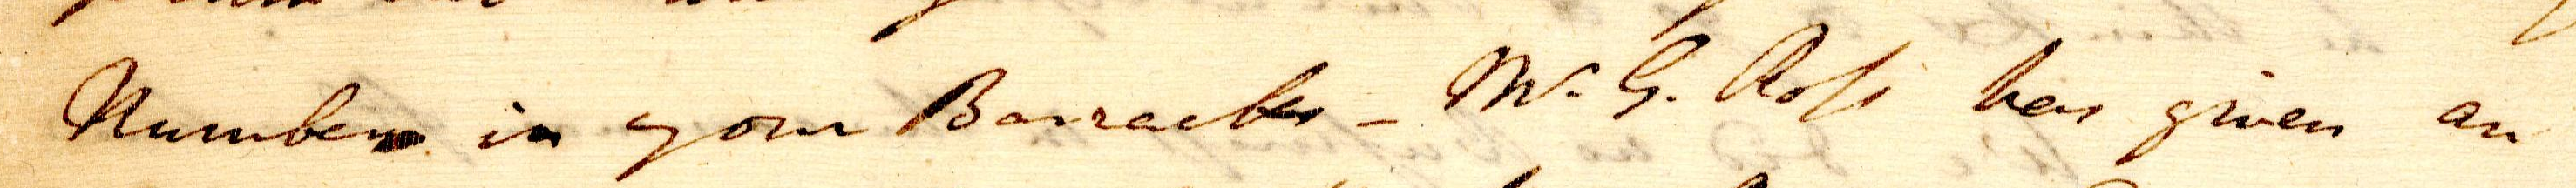Numbers in your Barracks. M^r. G. Ross has given an
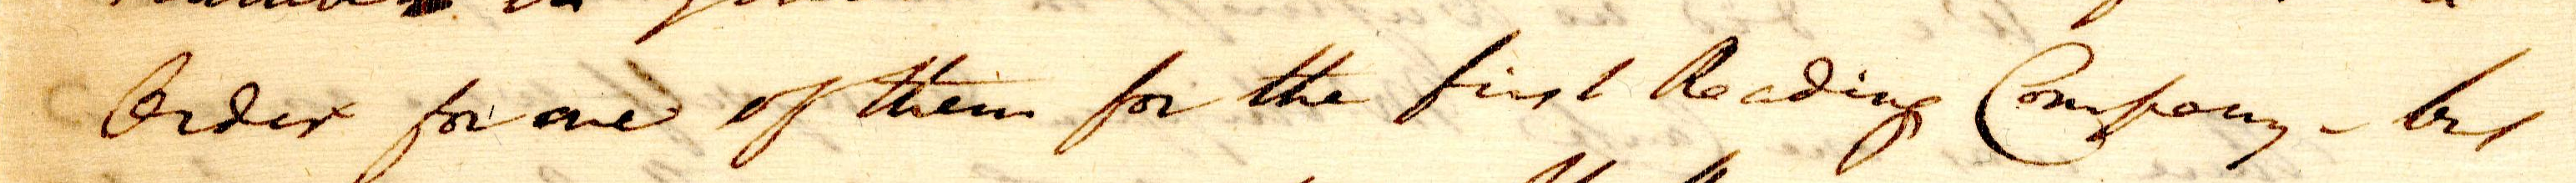Order for one of them for the first Reading Company, but
